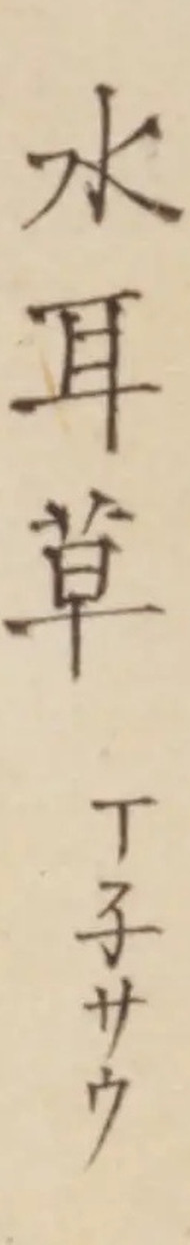水耳草丁子さう
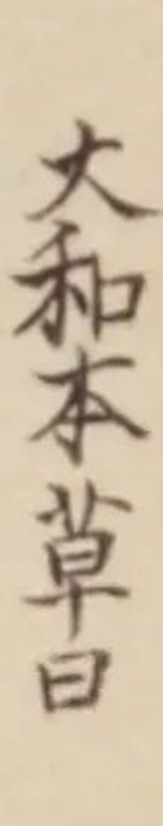救荒本草曰
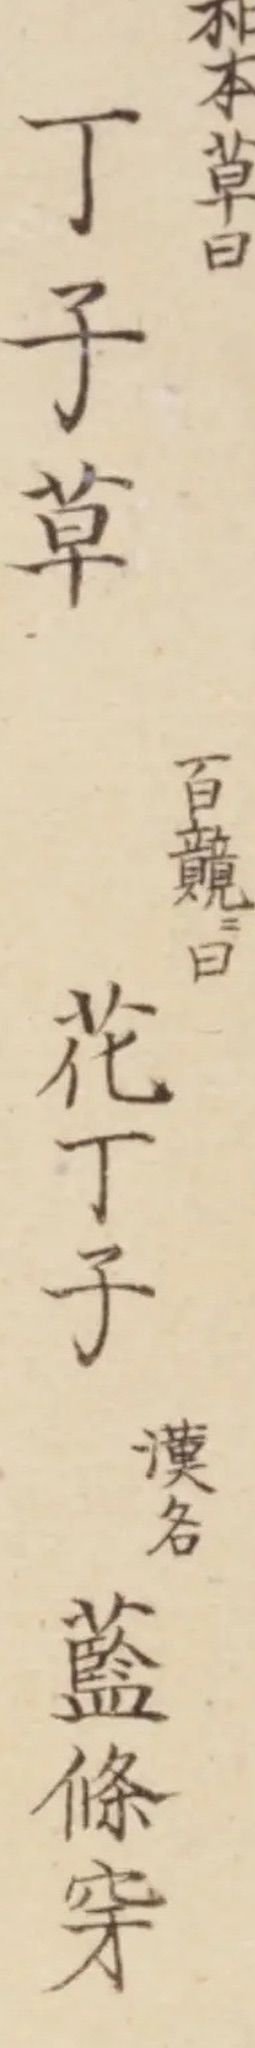丁子草花丁子漢名藍條穿
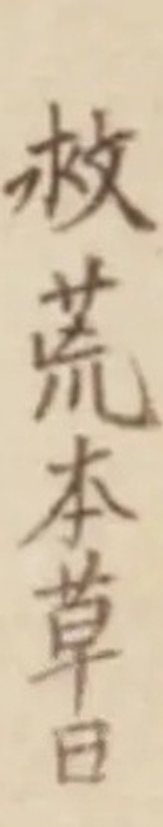救荒本草曰
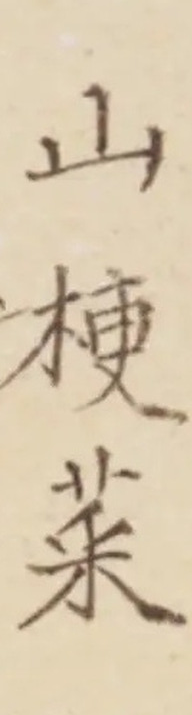山梗菜
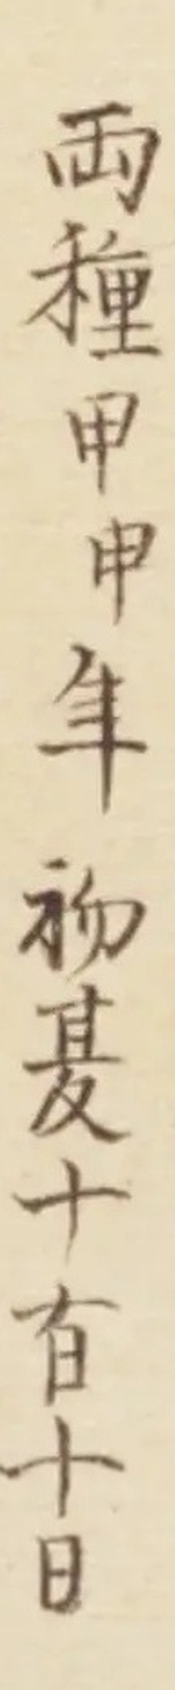両種甲申年初夏十有十日
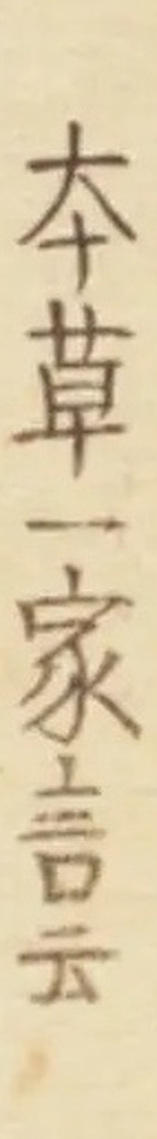本草一家言云
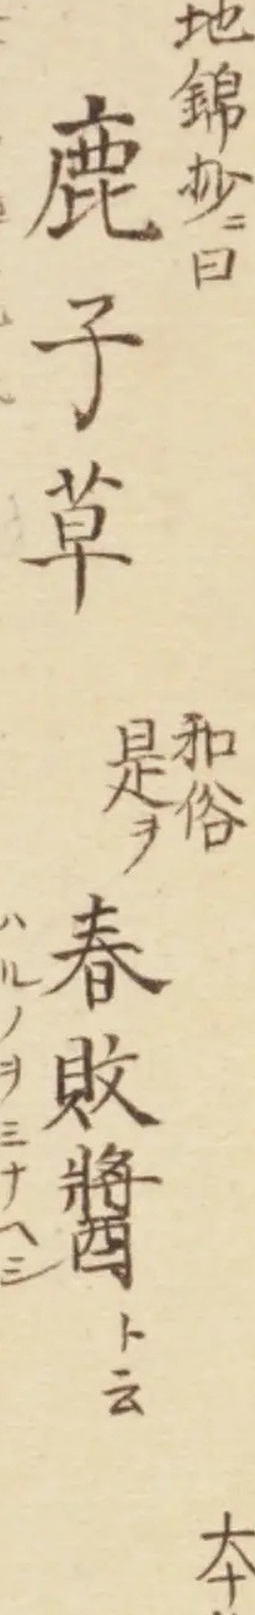鹿子草是を春敗醤と云

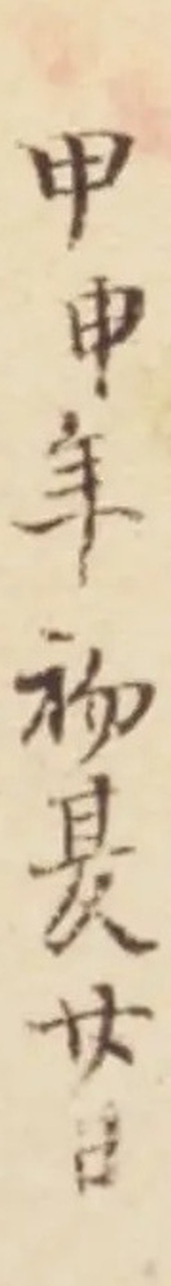甲申年初夏廿日

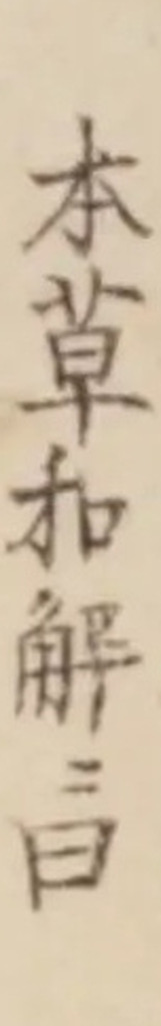本草和解曰
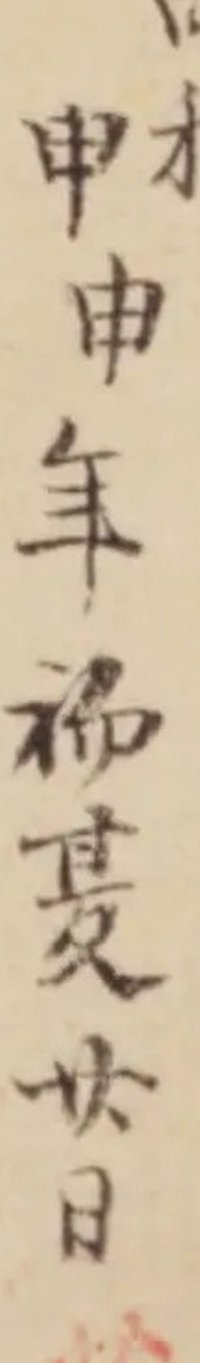甲申年初夏廿日
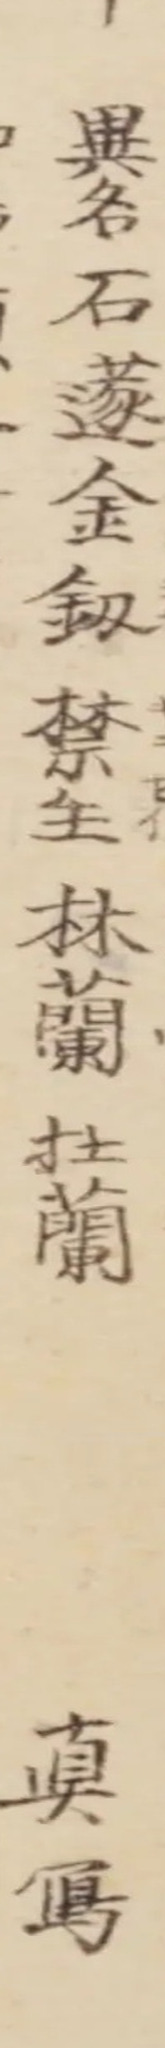石斛異名石金釼禁生林蘭杜蘭
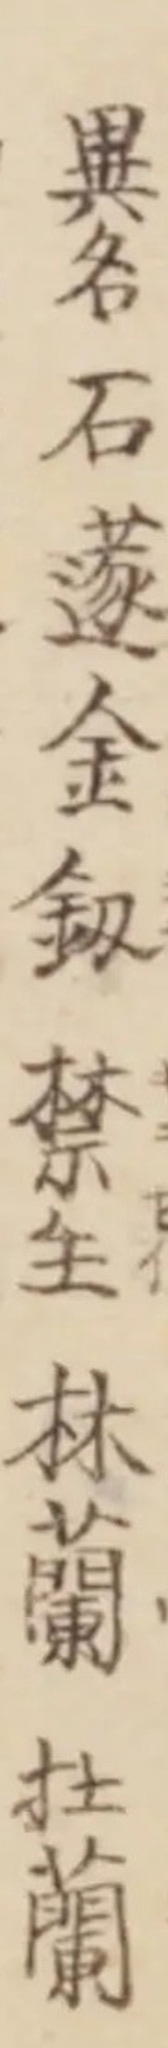石斛異名石金釼禁生林蘭杜蘭
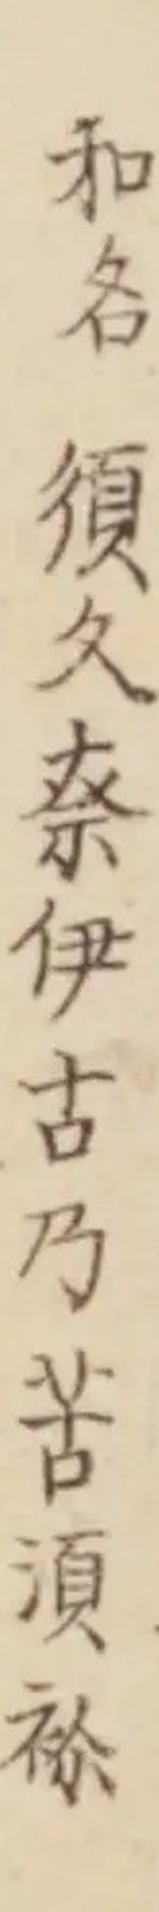和名須久奈良伊古之苦巣祢
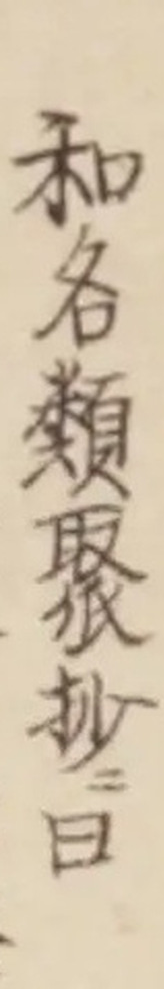和名類聚抄ニ曰
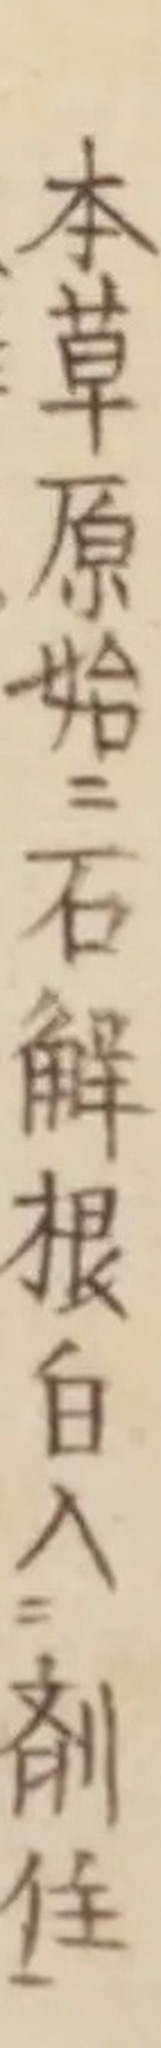本草原始に石解根白入剤住
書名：梅園草木花譜夏之部. 2
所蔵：国立国会図書館 National Diet Library, JAPAN
